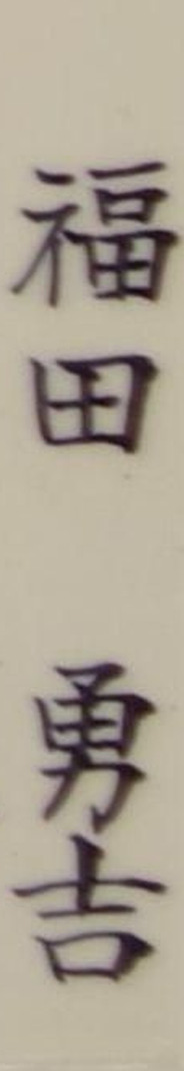福田勇吉
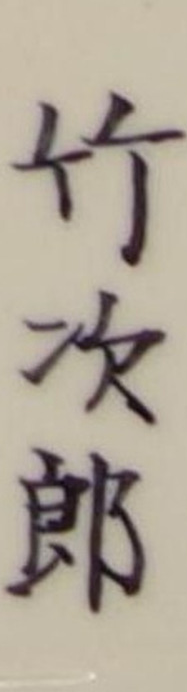竹次郎
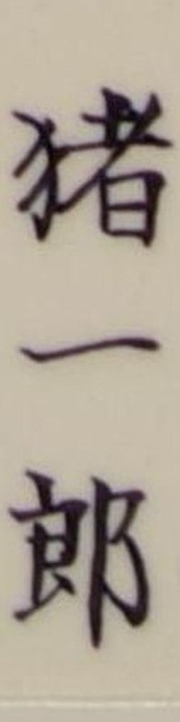猪一郎
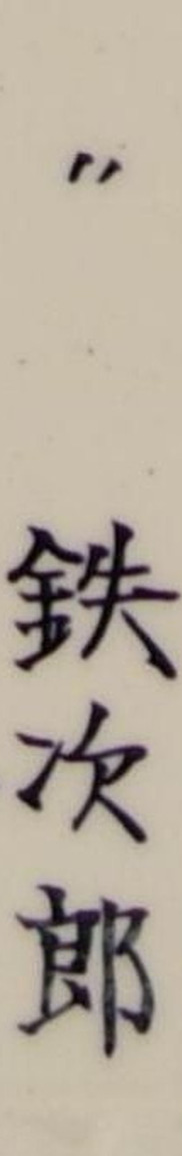鉄次郎
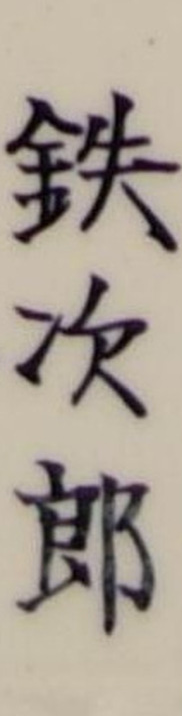鉄次郎
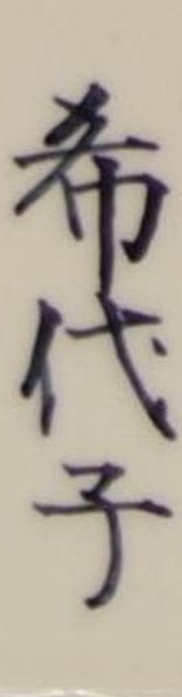希代子
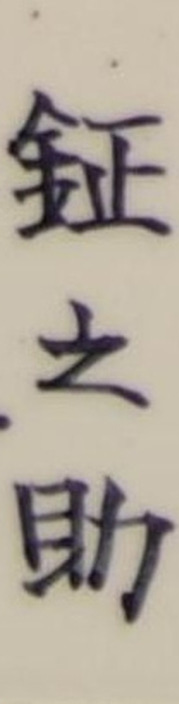鉦之助
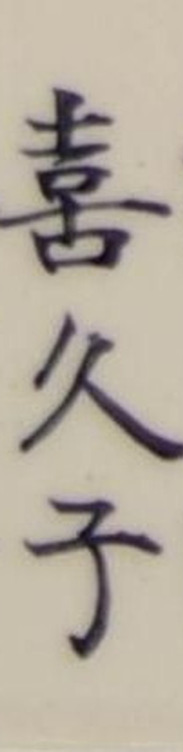喜久子
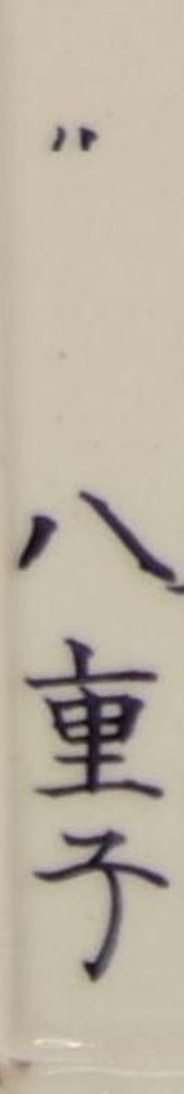八重子
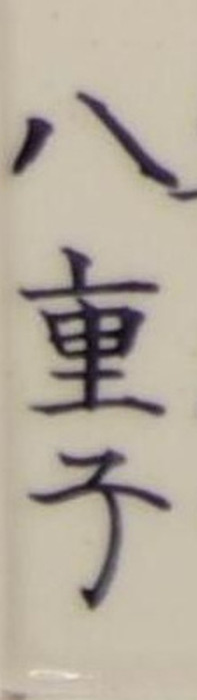八重子

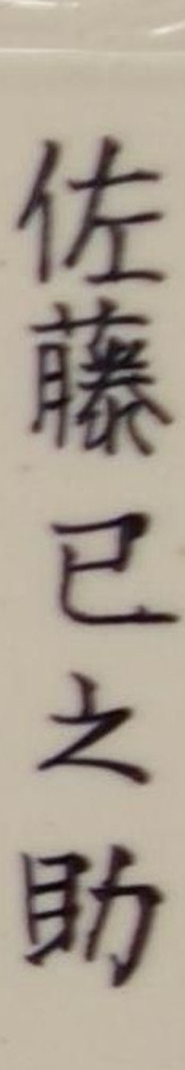佐藤巳之助
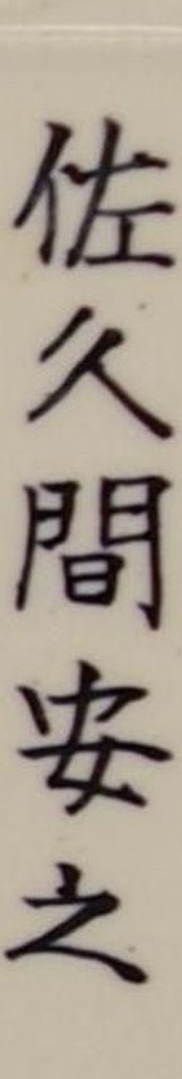佐久間安之
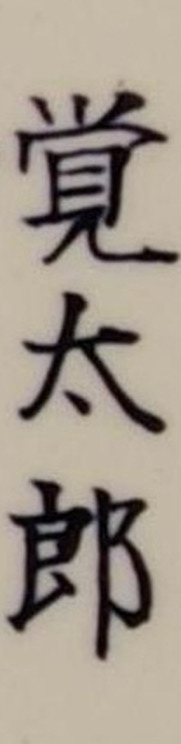覚太郎
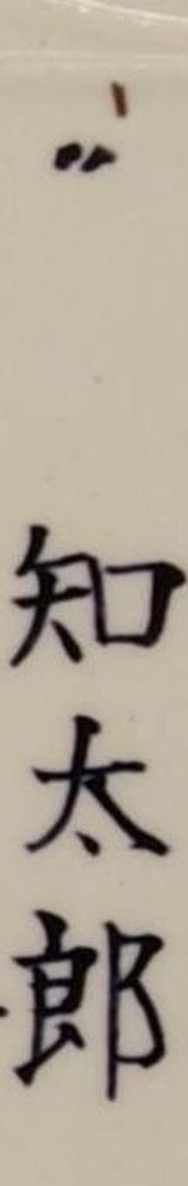知太郎
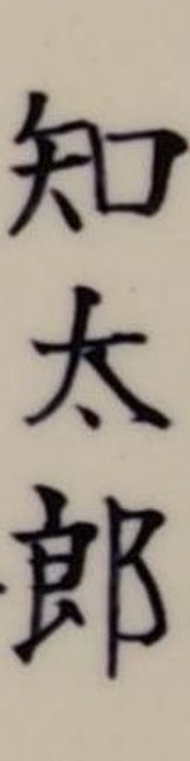知太郎
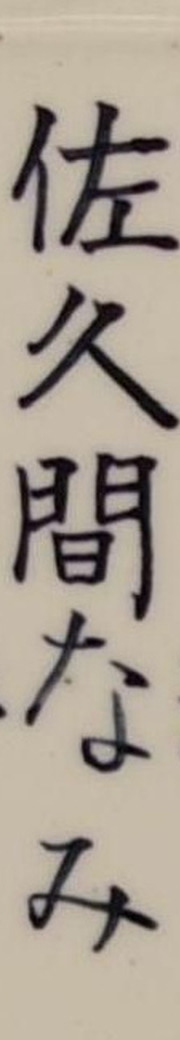佐久間なみ
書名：E~L
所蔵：高野山金剛峯寺
